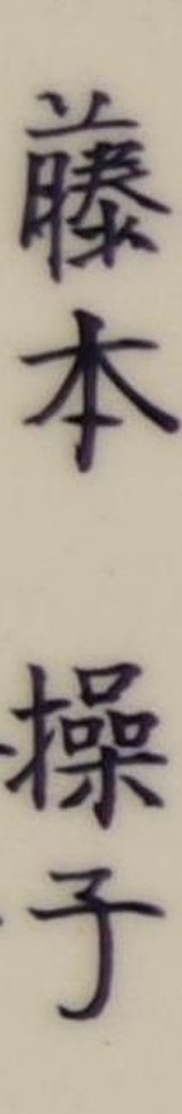藤本操子

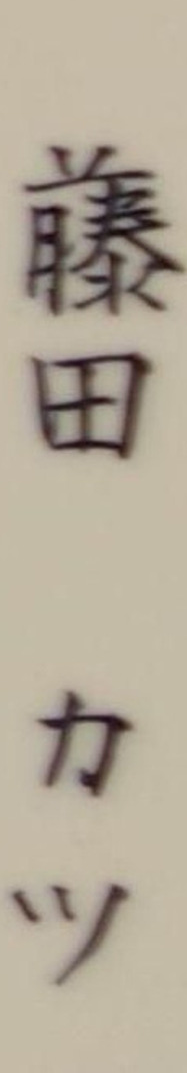藤田カツ
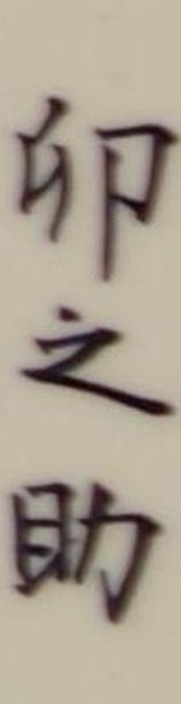卯之助
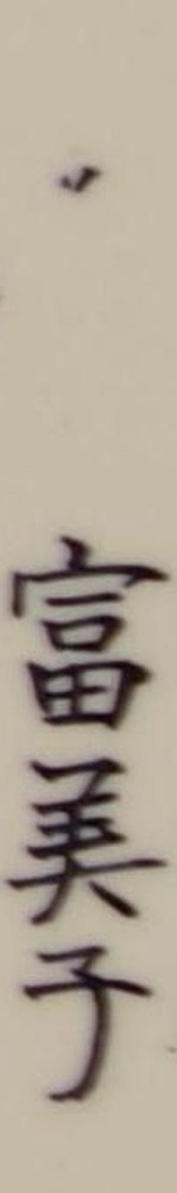富美子
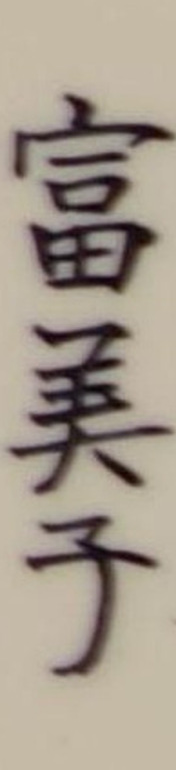富美子
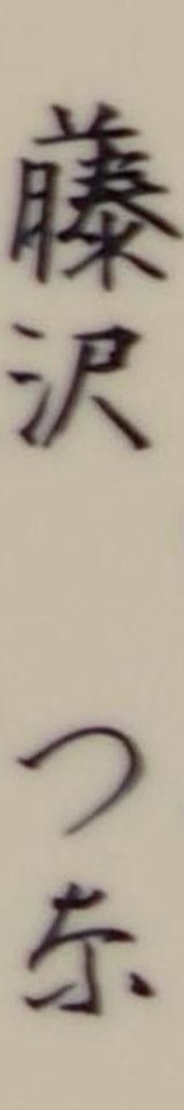藤沢つな
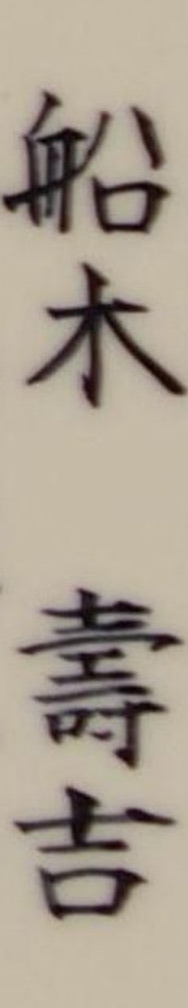船木壽吉
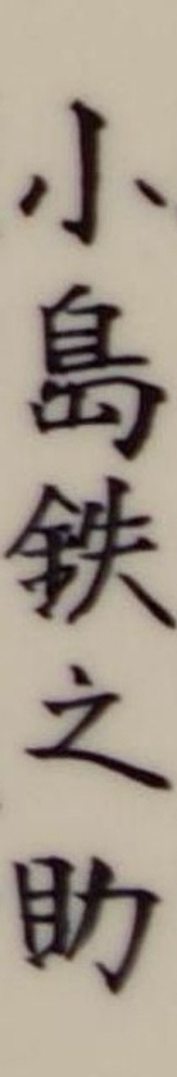小島鉄之助
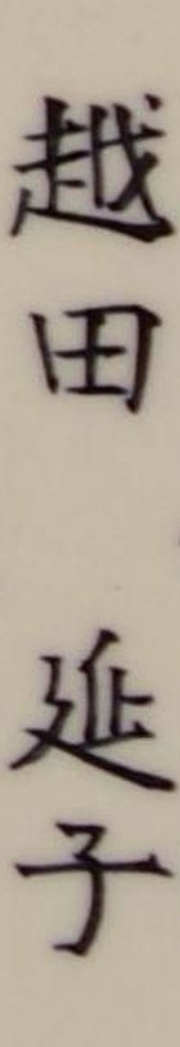越田延子
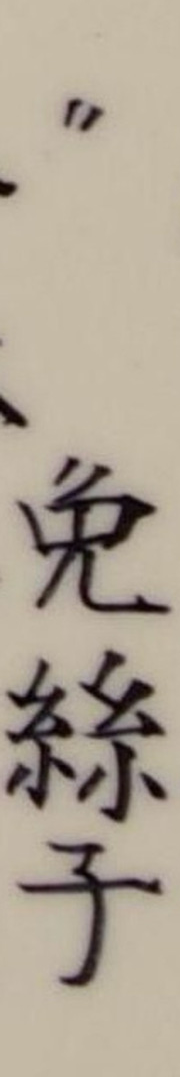免絲子
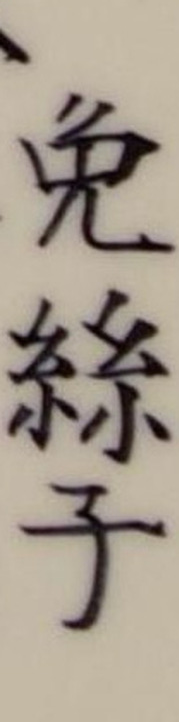免絲子
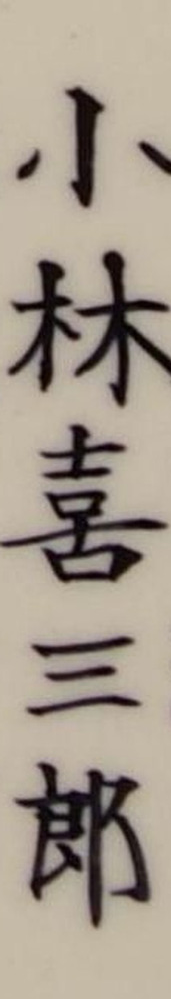小林喜三郎
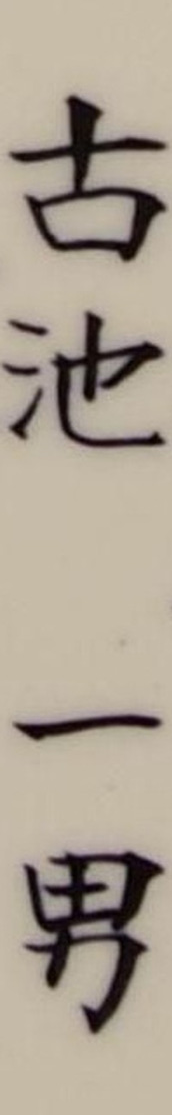古池一男
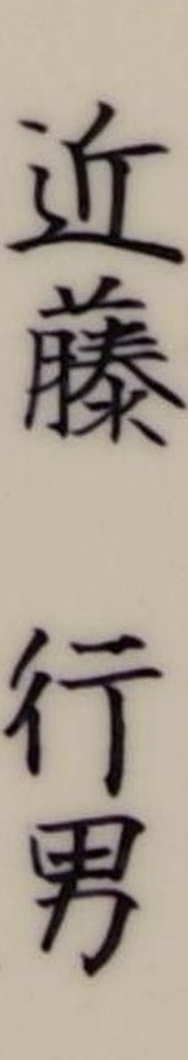近藤行男
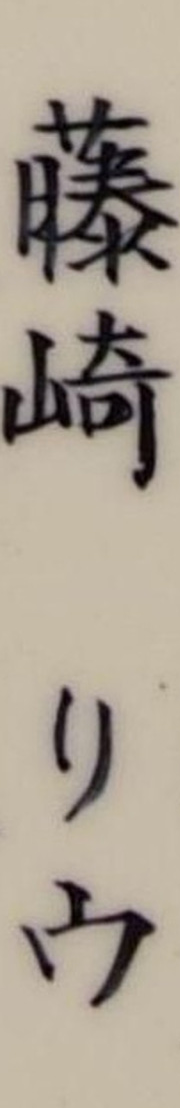藤崎リウ
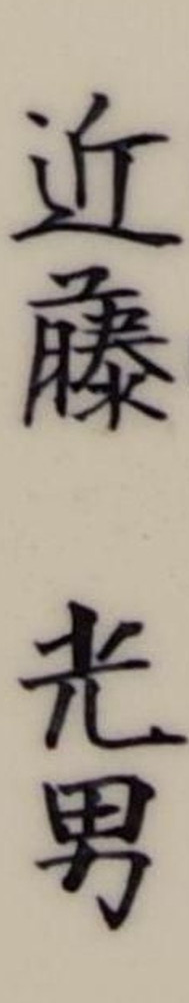近藤光男
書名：M~S
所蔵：高野山金剛峯寺
